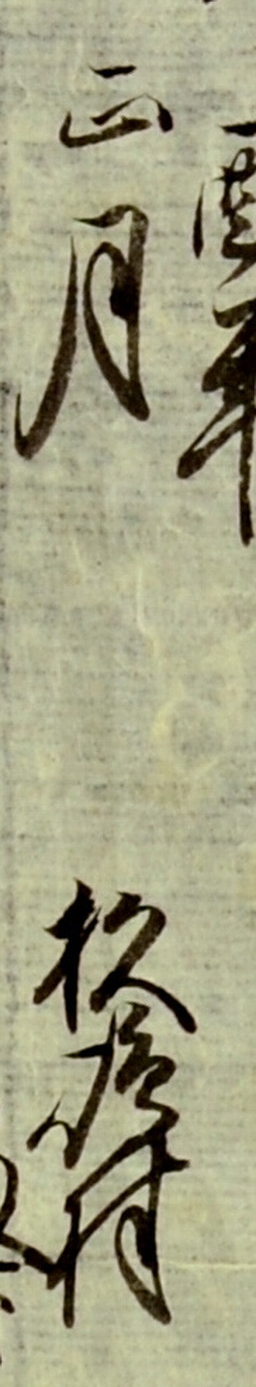正月松嶋村
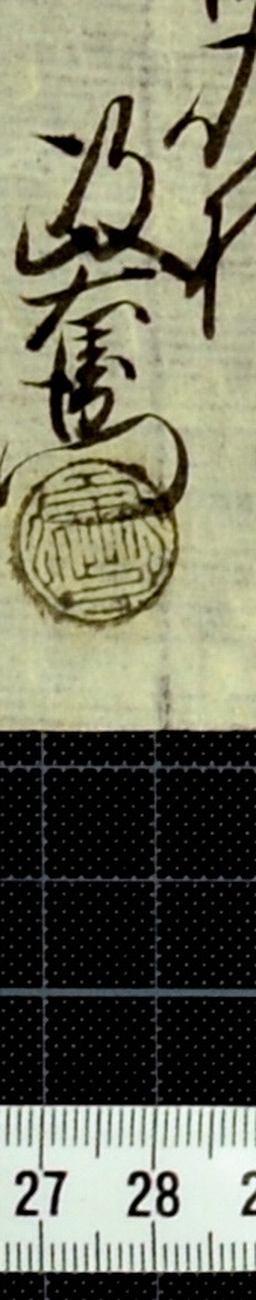政右衛門印
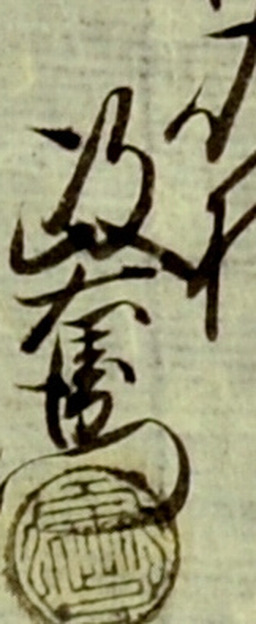政右衛門印
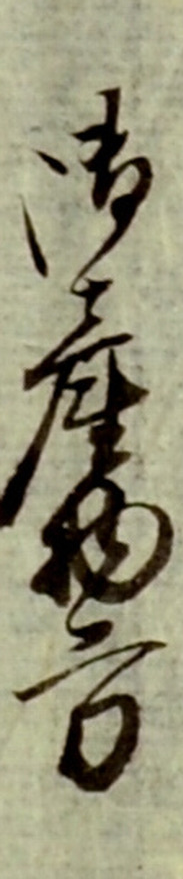御産物方
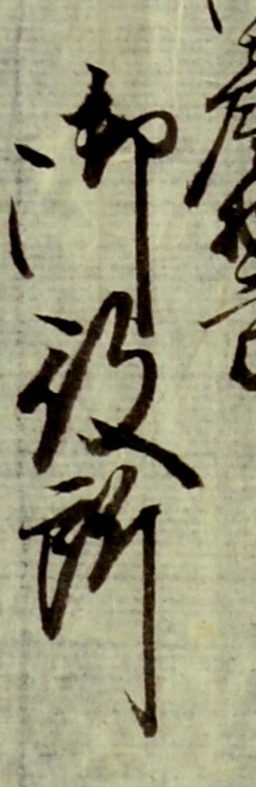御役所
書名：覚
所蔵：伊那市立高遠町図書館・合同会社AMANE
